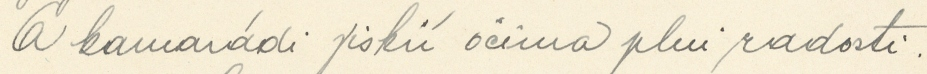A kamarádi jiskří očima plni radosti.
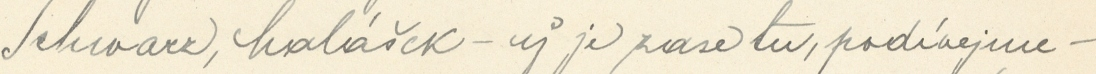Schwarz, Malášek - už je zase tu, podívejme -
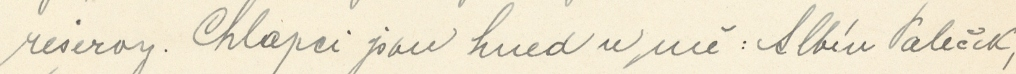reservy. Chlapci jsou hned u mě: Albín Paleček,
